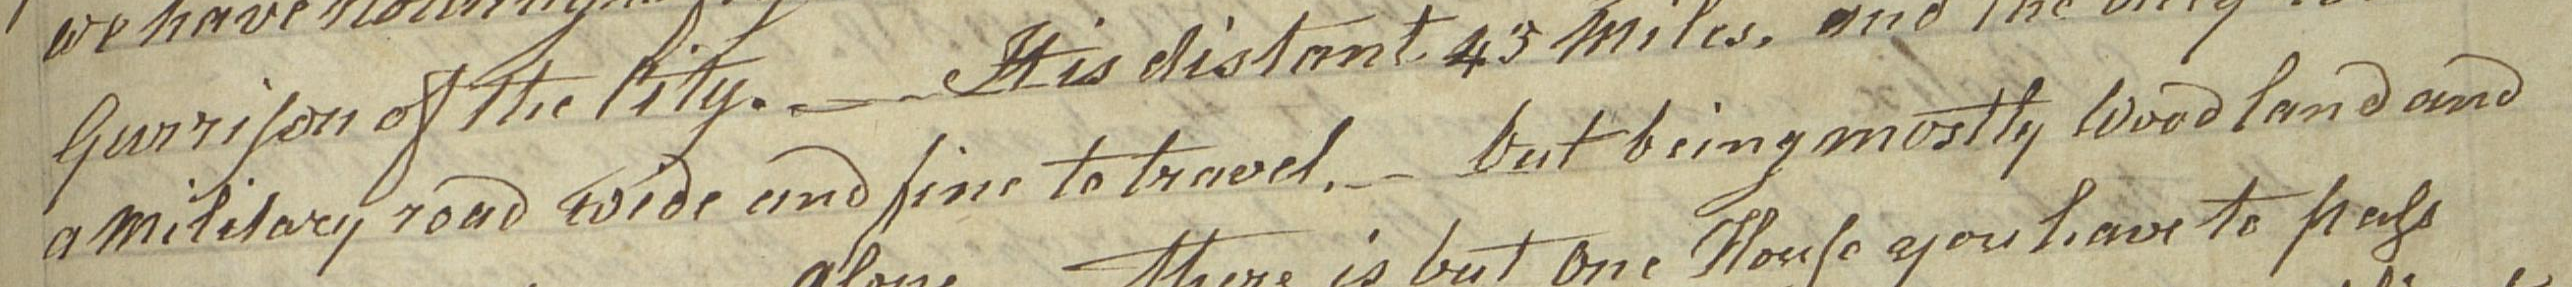a Military road wide and fine to travel. but being mostly Wood land and
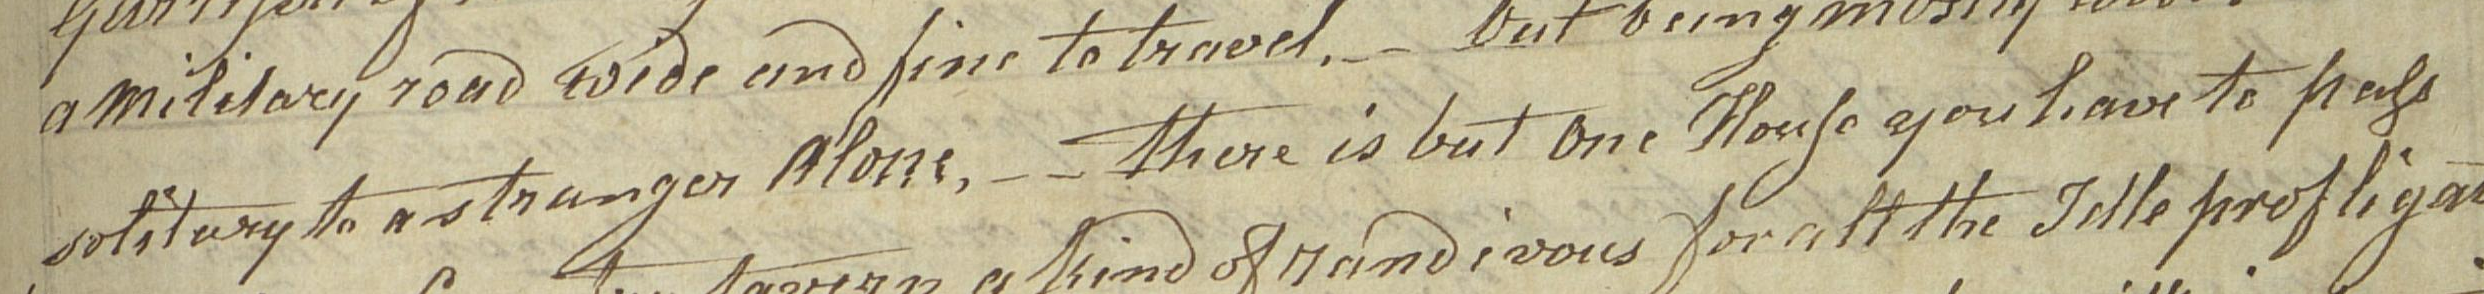solitary to a stranger alone, there is but one House you have to pass
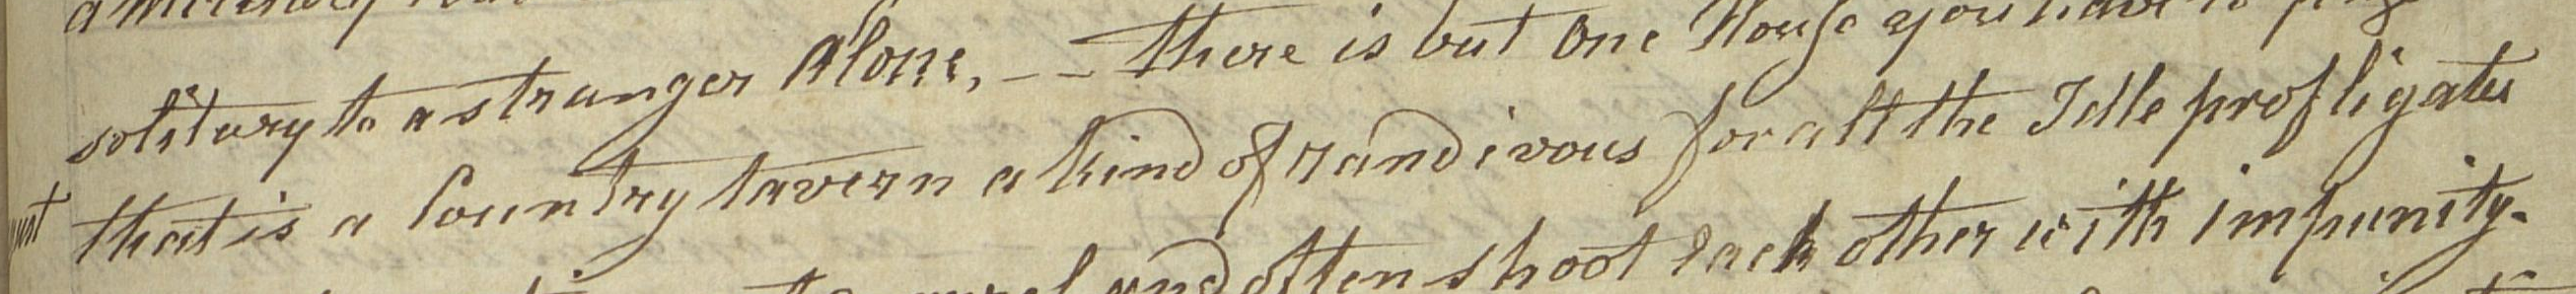-ust that is a Country tavern a kind of randivous for all the Jalle profligates
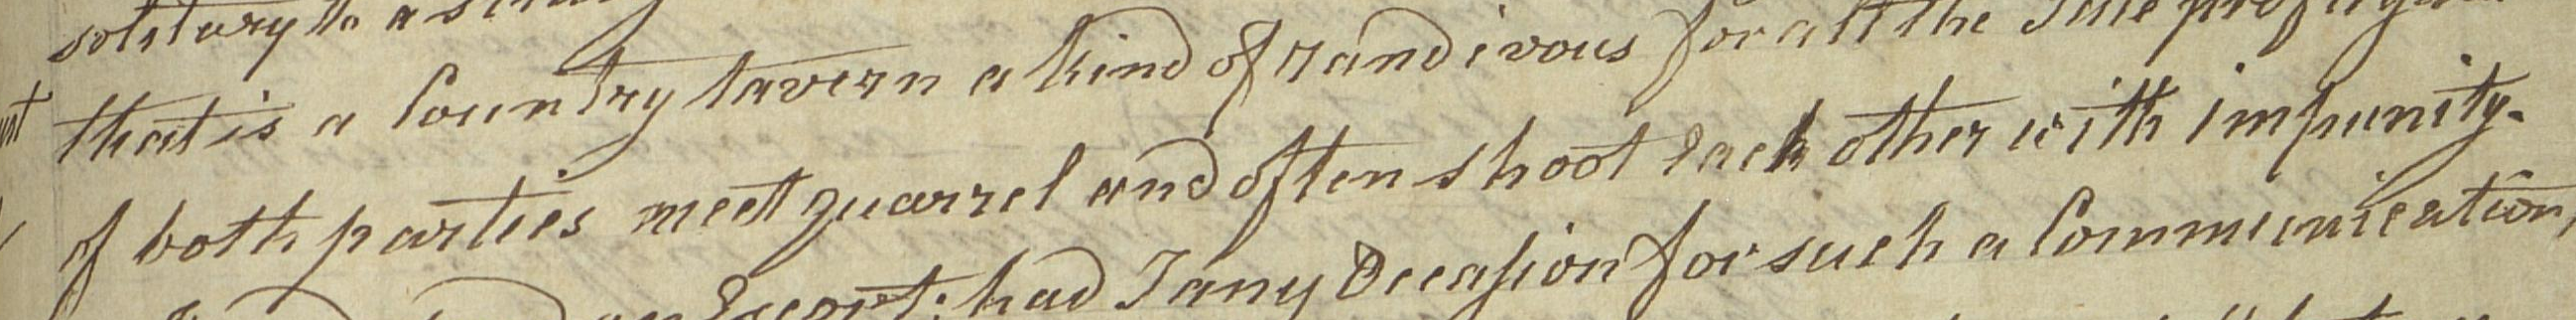of both parties meet quarrel and often shoot each other with impunity.
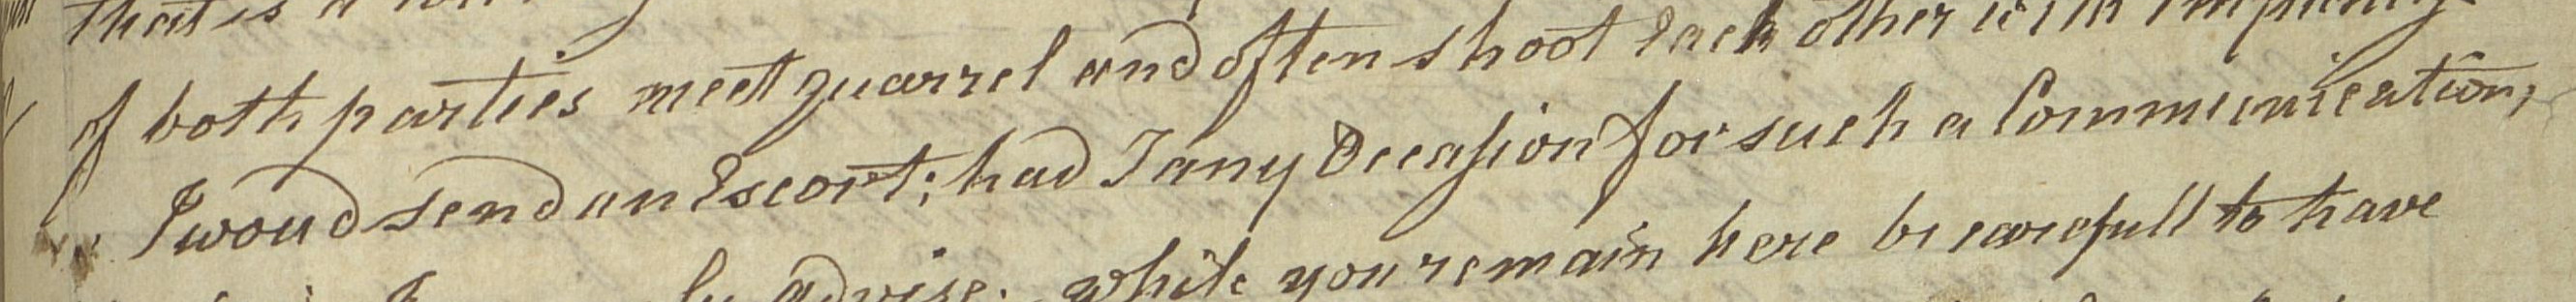I woud send an Escort; had I any Occasion for such a Communication,
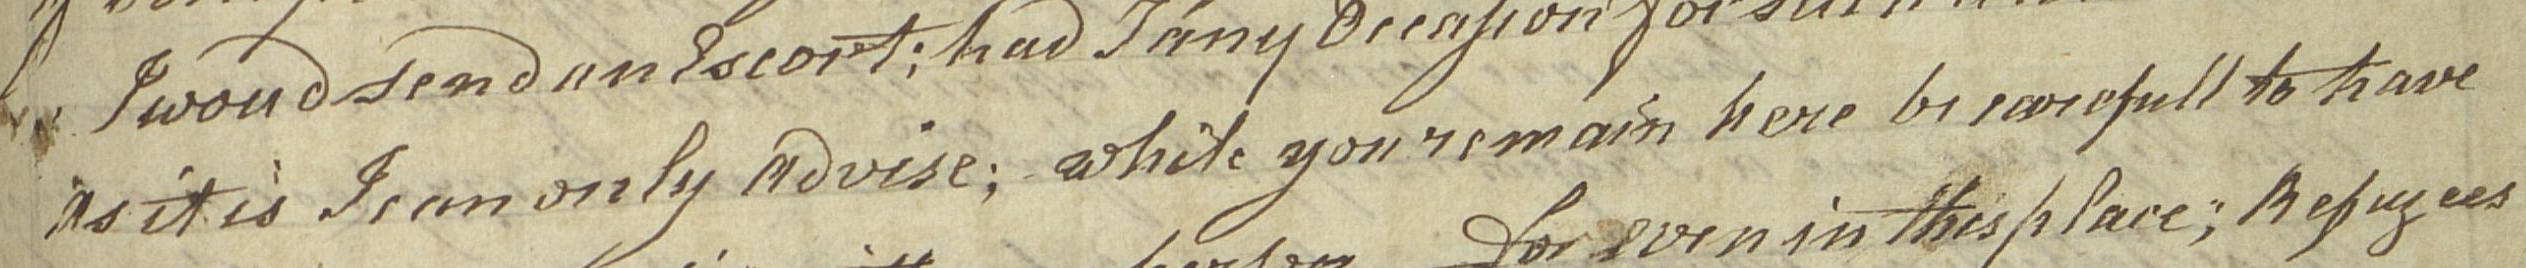as it is I can only Advise; while you remain here be carefull to have
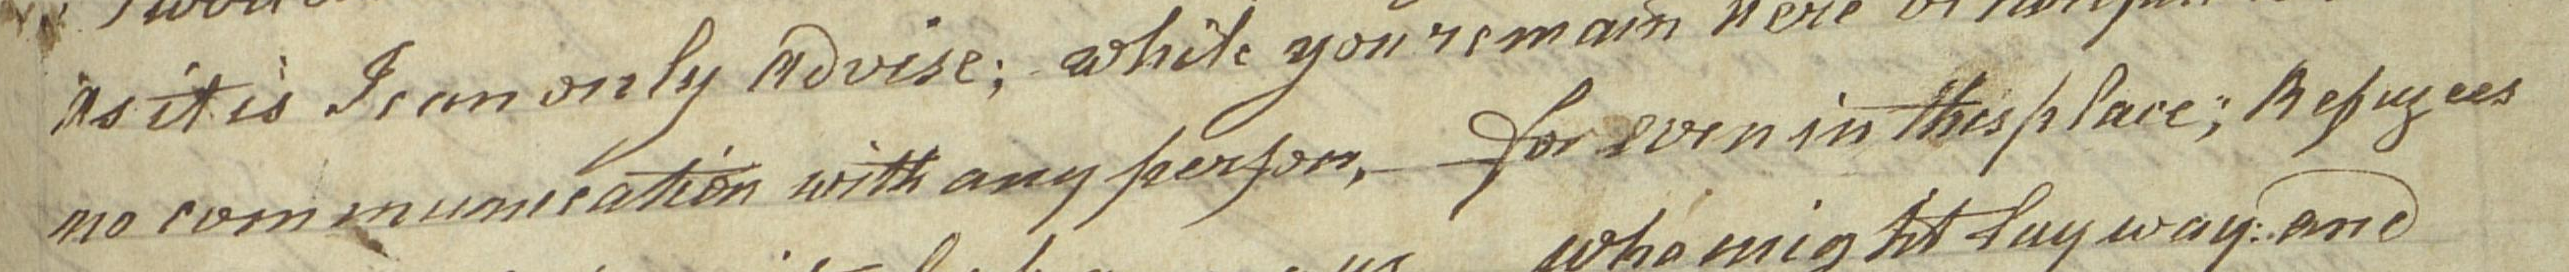no communication with any person, for even in this place; Refugees
